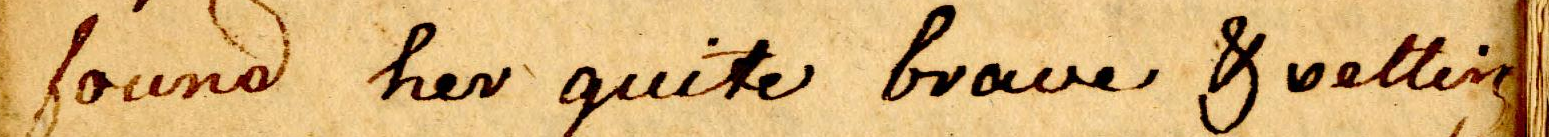found her quite brave & setting
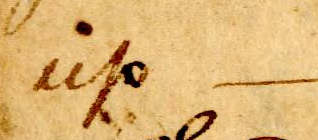up-
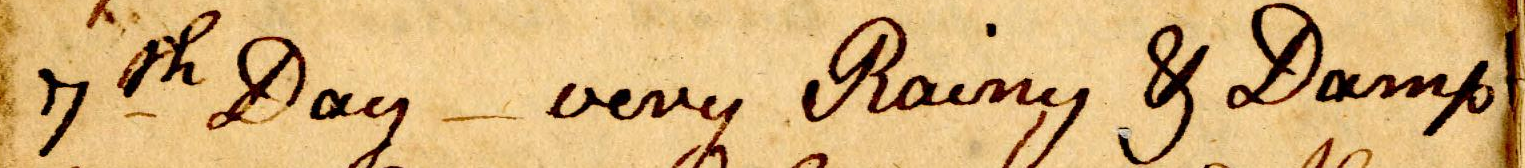7^th Day- very Rainy & Damp
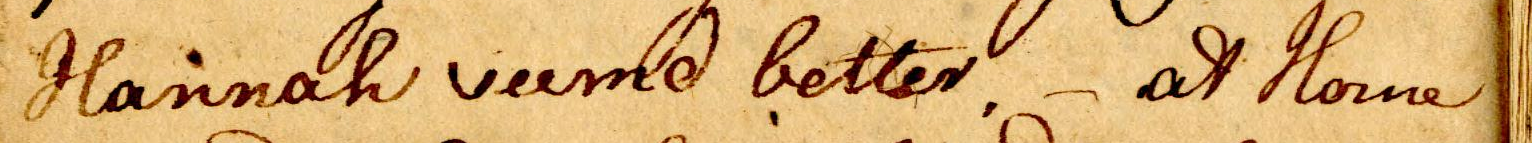Hannah seemd better,- at Home
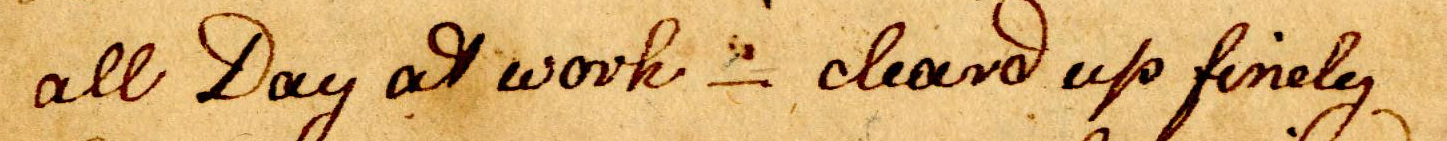all Day at work- cleard up finely
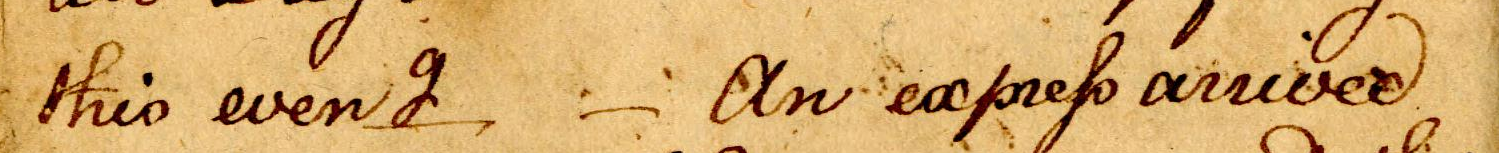this even^g.- An express arrived
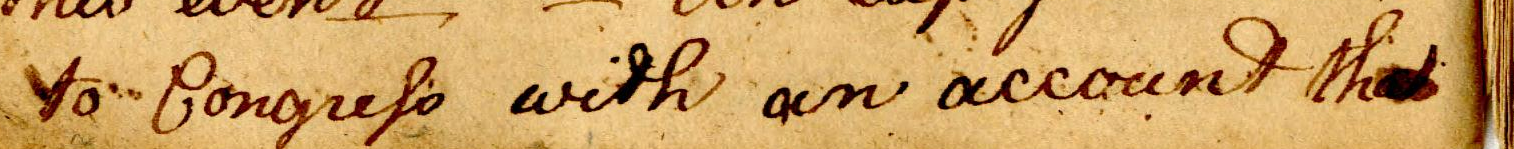to Congress with an account that
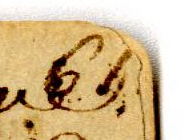61
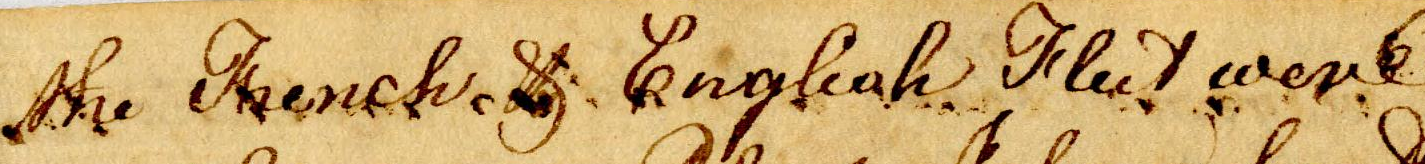the French- & English Fleet were
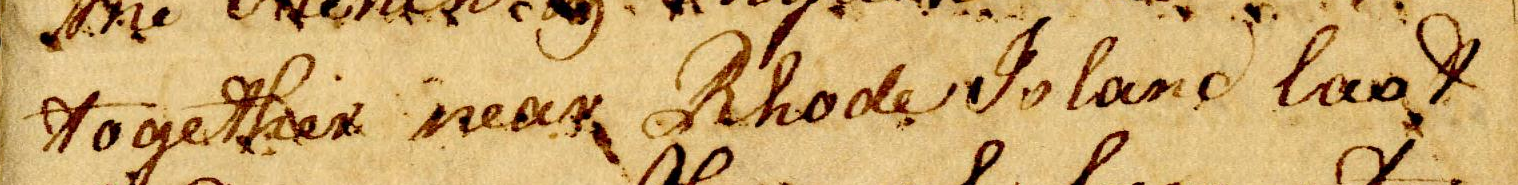together near Rhode Island last
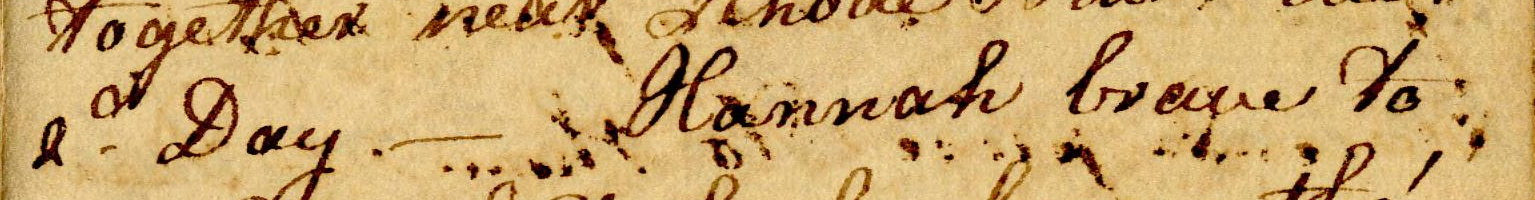2^d Day- Hannah brave to
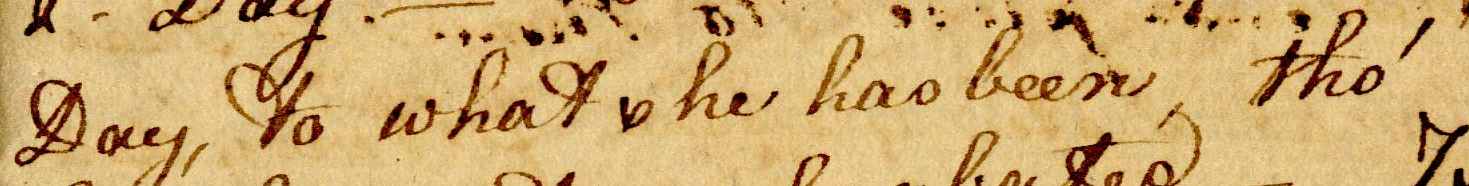Day, to what she has been, tho'
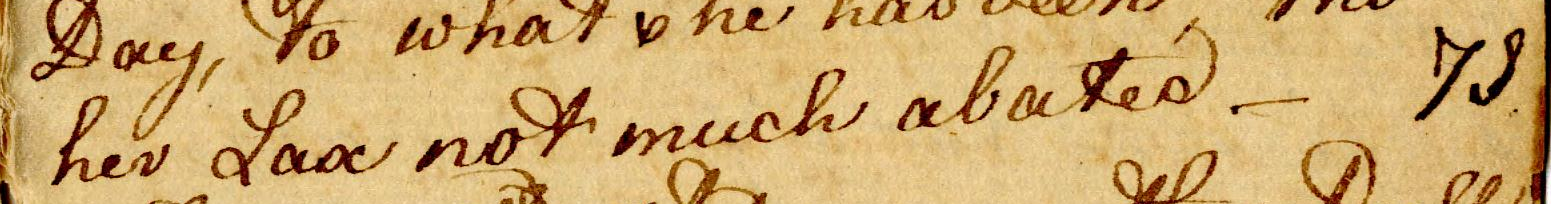her Lax not much abated- 7S
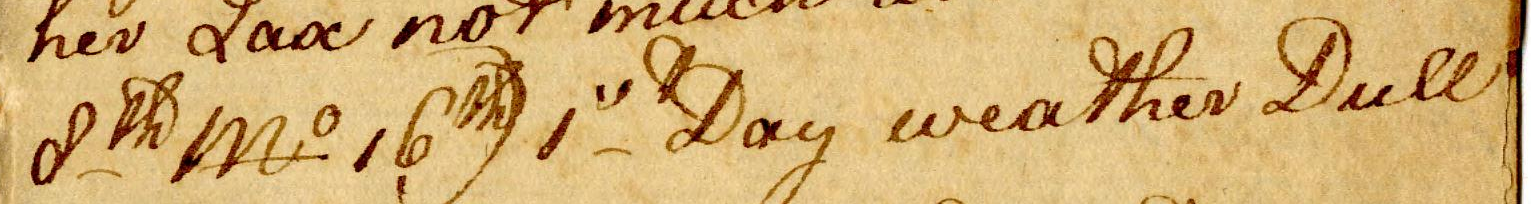8^th M^o 16^th) 1^st Day weather Dull
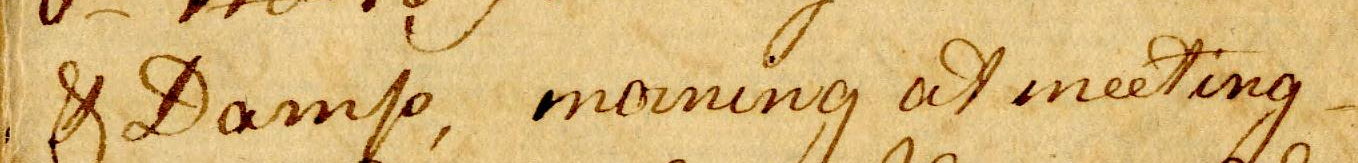& Damp, morning at meeting
